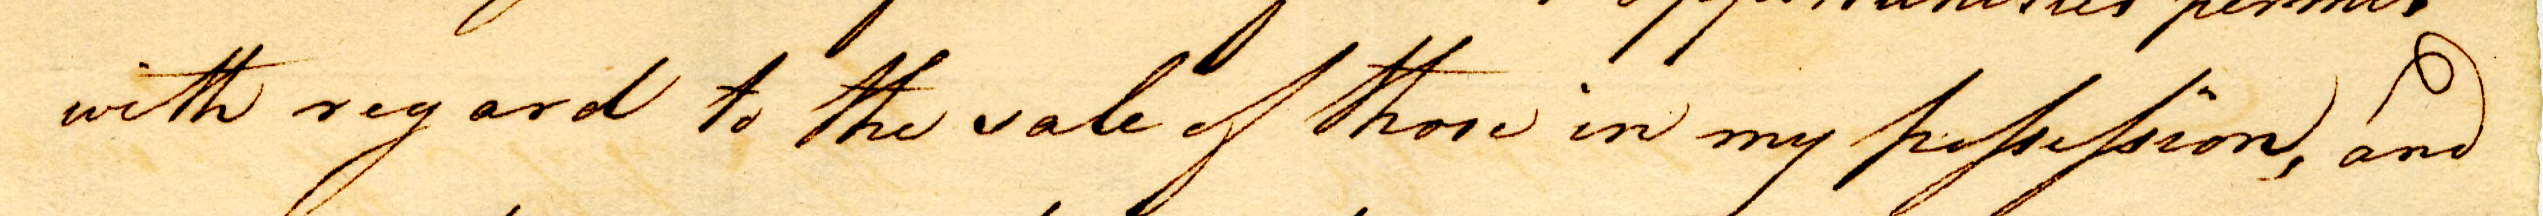with regard to the sale of those in my possession, and
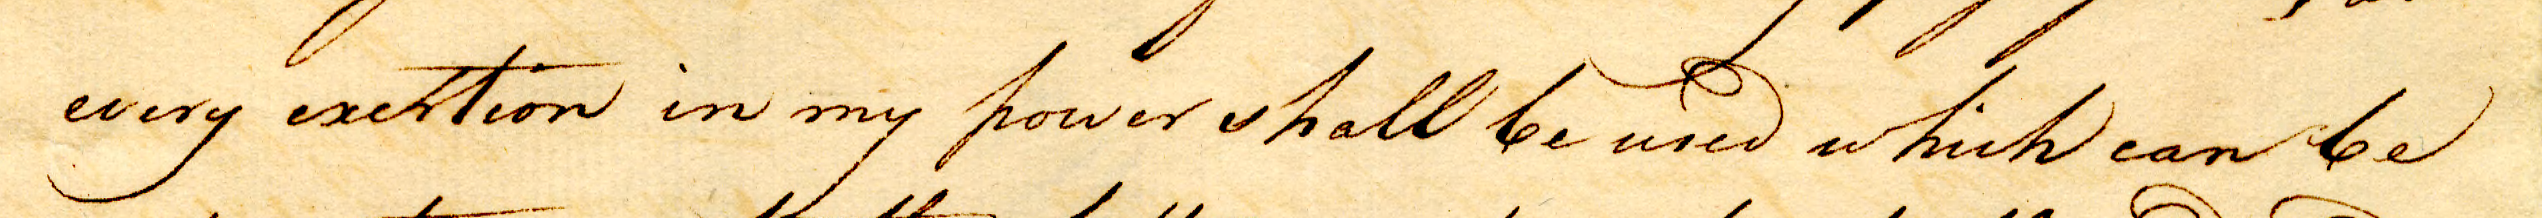every exertion in my power shall be used which can be
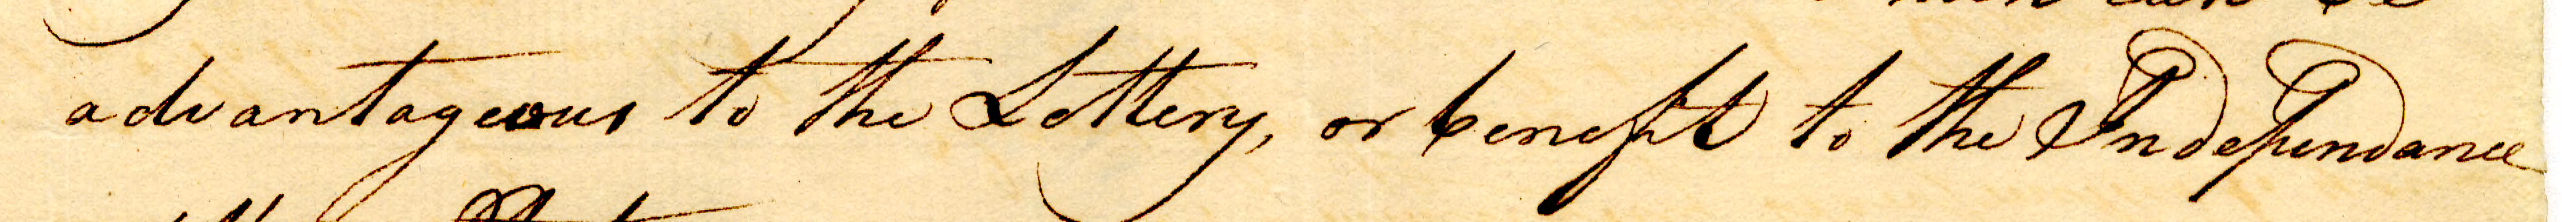advantageous to the Lottery, or benefit to the Independance
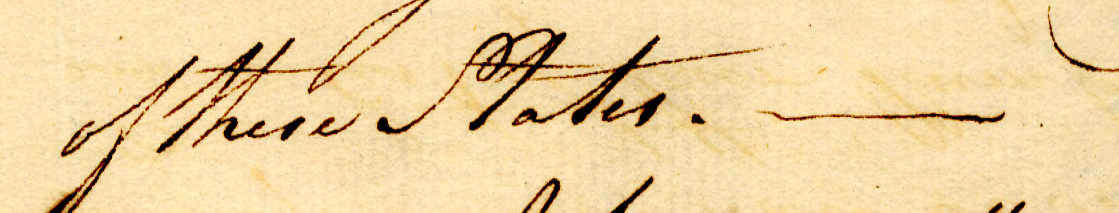of these States.-
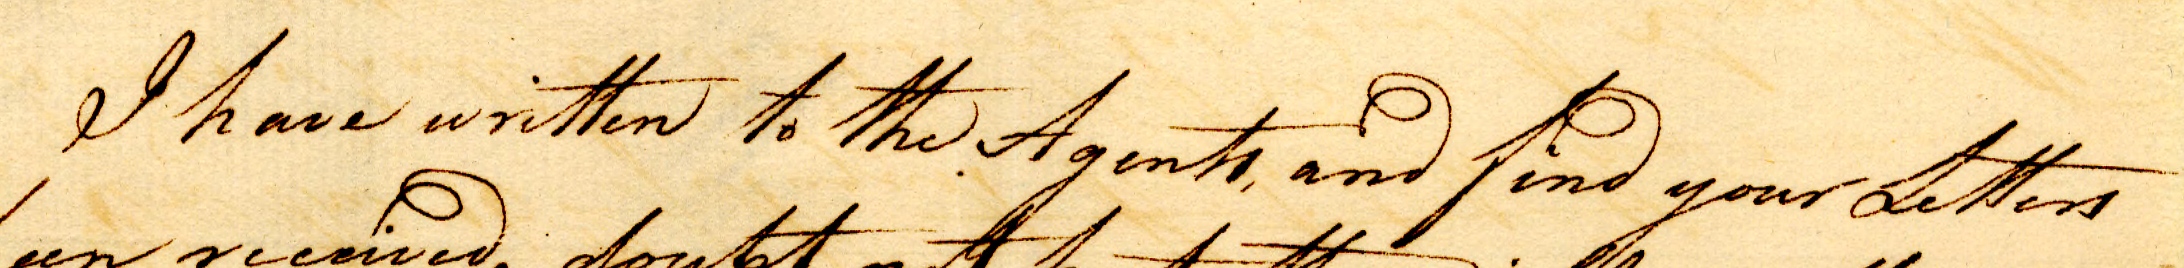I have written to the Agents and find your Letters
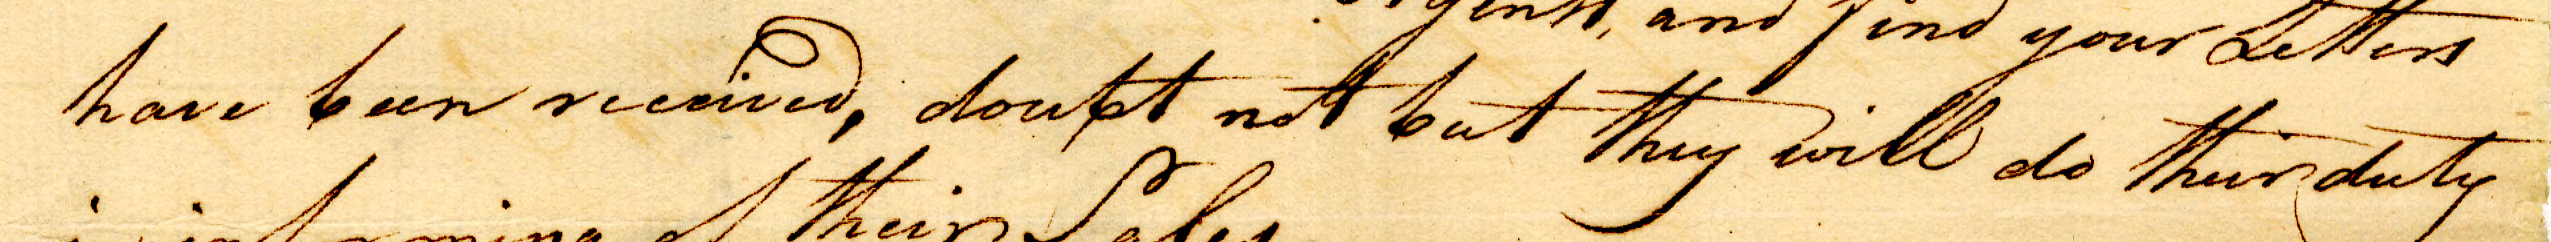have been received, doubt not but they will do their duty
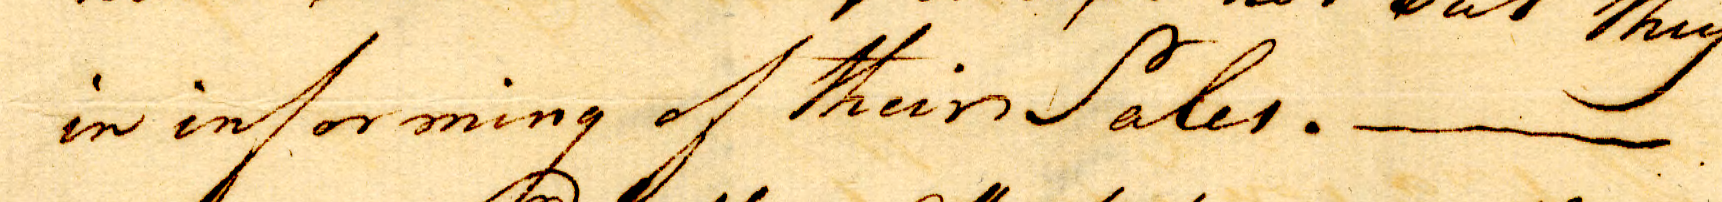in informing of their Sales.-
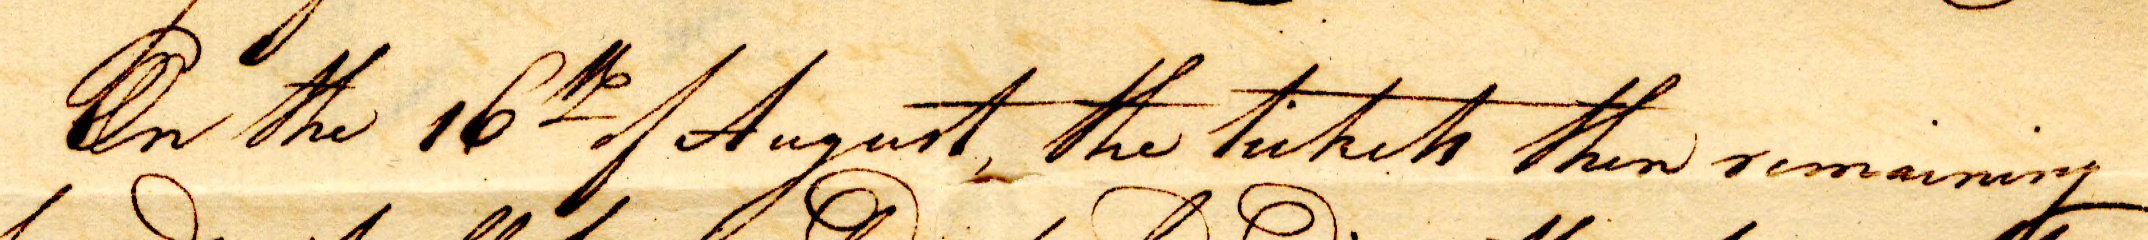On the 16^th of August, the tickets then remaining
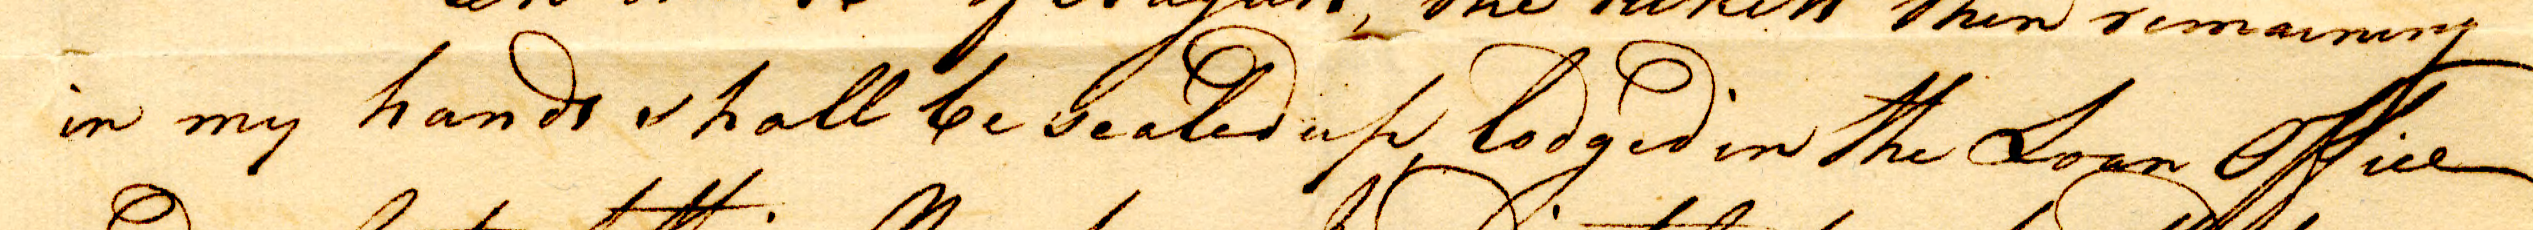in my hands shall be sealed up, lodged in the Loan Office
